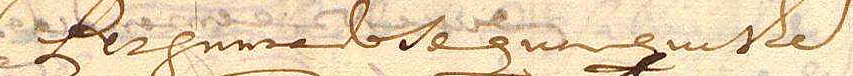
Perguntado se quer que lhe
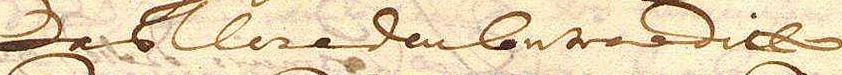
ta Meza deu Contra o ditto
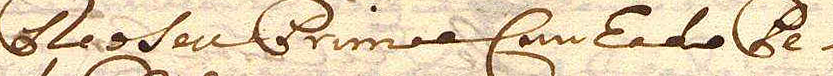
Reo seo Primo o Cunhado Pe
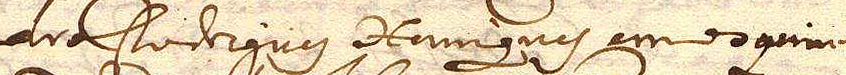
dro Rodrigues Henriques em os quin
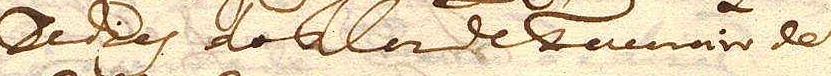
ze dias do Mez de Feuereiro de
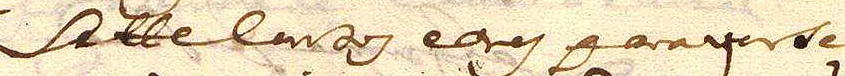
Settecentos e tres para ver se
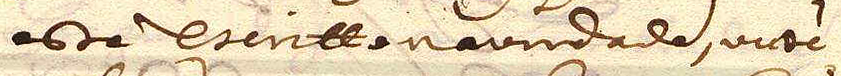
esta escritto na verdade, ou tē
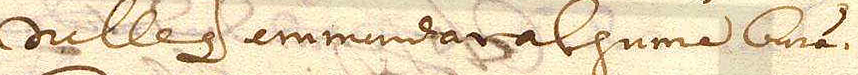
nelle q̄ emmendar alguma Couza?
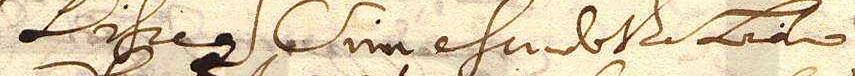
Disse q̄ Sim, e sendolhe Lido
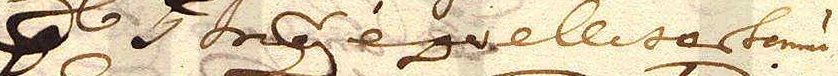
pelo s.r Inqr e por elle taõbem?
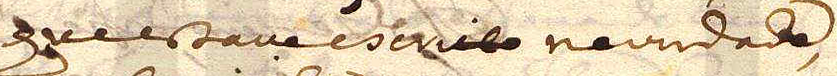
que estaua escrito na verdade,
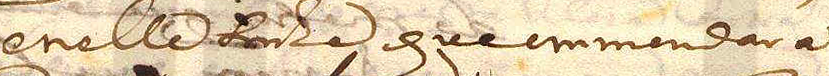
e nelle tinha que emmendar a
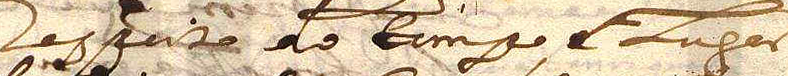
Respeito do tempo, e Lugar
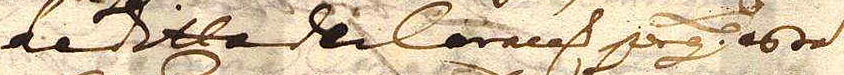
da ditta declaraçaõ porq.to esta
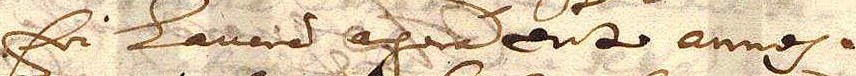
foi havera agora outo annos e
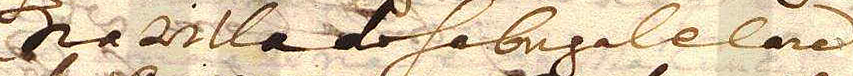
na villa do sabugal e Caza
